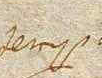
tempo
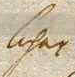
lugar
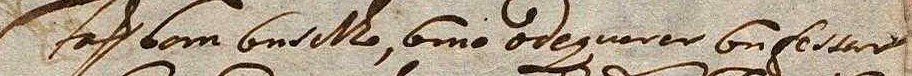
taõ bom conselho, como o de querer confessar
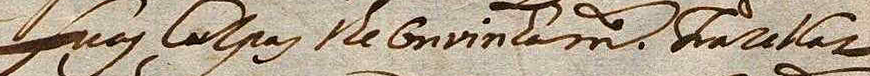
suas Culpas lhe convinha m.to trazellaz
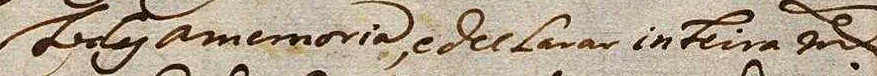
todas a memoria, e declarar inteiram.te
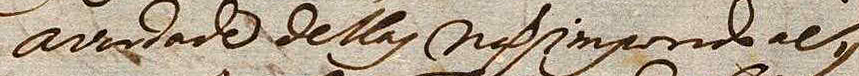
a verdade dellas naõ impondo a sy
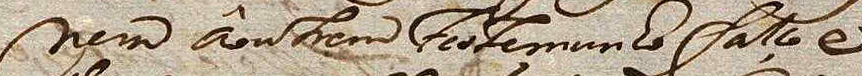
nem â outrem testemunho falço e
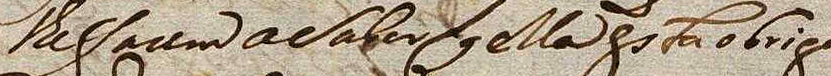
lhe fazem a Saber q̄ ella esta obriga
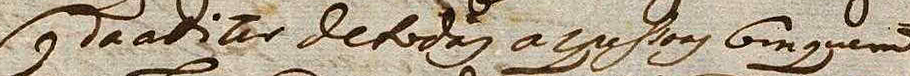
da a dizer de todas as pessoas com quem
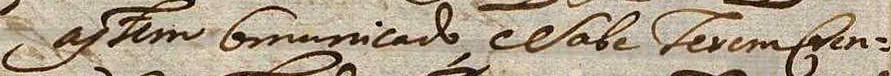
as tem comunicado, e Sabe terem Cren
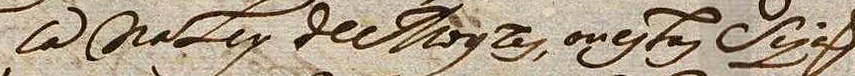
ça na Ley de Moyzes, ou estas Sejaõ
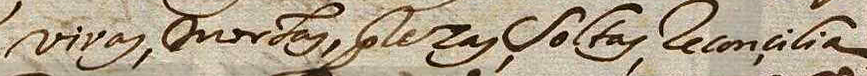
vivas, mortas, prezas, Soltas, Reconçilia
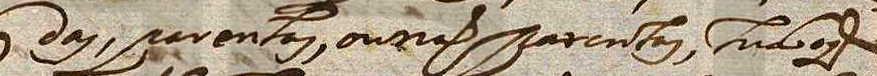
das, parentas, ou naõ parentas, tudo o q̄
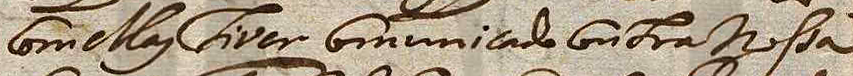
com ellas tiver comunicado contra nossa
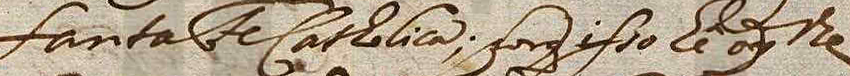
santa Fe Catholica; porq̄ isso hê o q̄ lhe
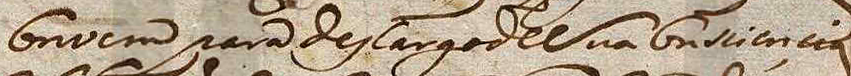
convem para descargo de Sua consciençia
